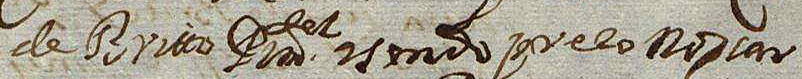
de Britto Pim.tel E sendo prezo nos car
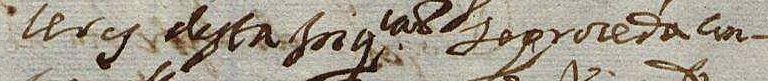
ceres desta Inq.çaõ se proceda con
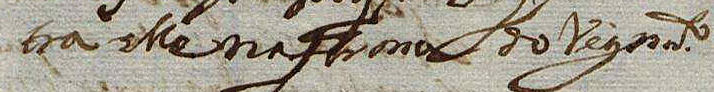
tra elle na forma do Regim.to
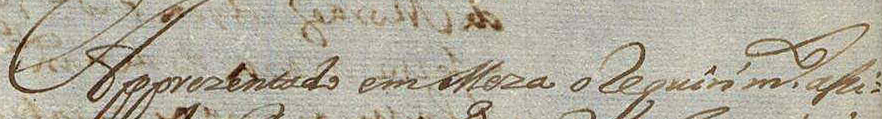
Apprezentado em Meza o Requerim.to assi
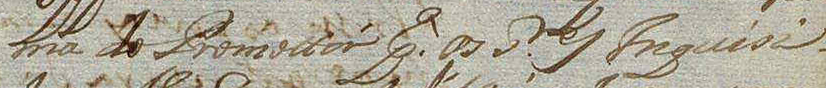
ma do Promottor p.a os s.res Inquisi
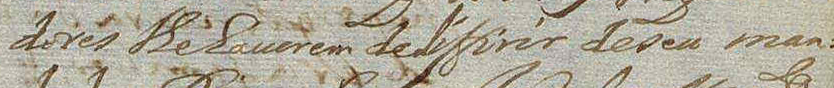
dores lhe hauerem de diffirir de seu man
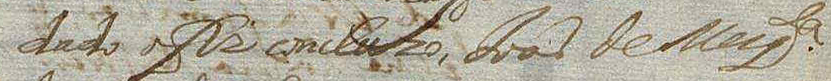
dado o fiz concluzo, Ioaõ de Mesq.ta
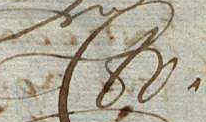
Clo.
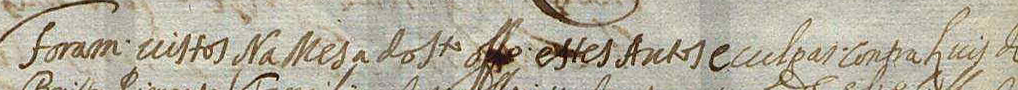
Foram uistos Na Mesa do Sto offo. estes Autos e culpas contra Luis de
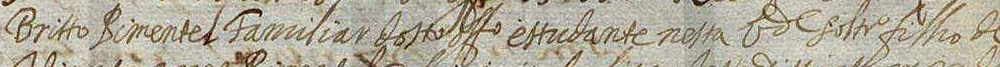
Britto Pimentel Familiar do sto offo estudante nesta Vde soltro filho de
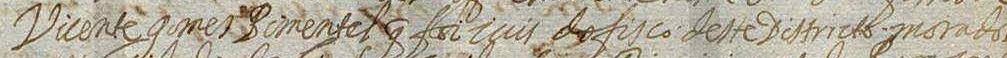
Vicente Gomes Pimentel q̄ foi iuis do fisco deste Districto morador
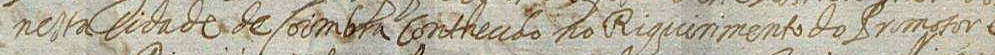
nesta cidade de Coimbra contheudo no Riquirimento do Promotor, e
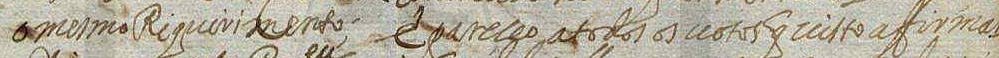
o mesmo Riquirimento; E pareceo a todos os uotos q̄ uisto affirmar
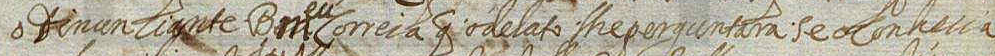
o Denunciante Bmeu Correia q̄ o delato lhe perguntara se o Conhecia
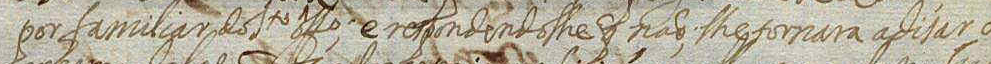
por familiar do Sto offo, e respondendolhe q̄ naõ; lhe tornara a disar o
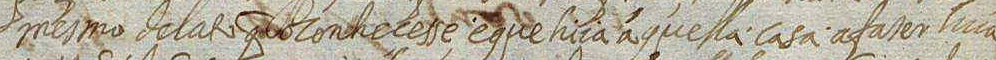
mesmo delato q̄ o conhecesse, e que hia áquella casa a fazer huā
